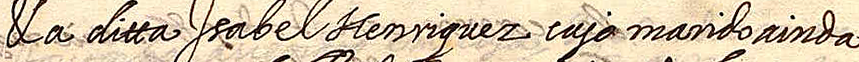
& a ditta Jsabel Henriquez cujo marido ainda
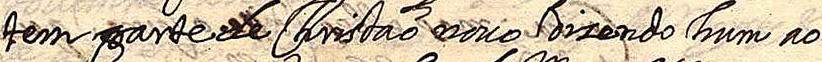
tem parte de Christaõ nouo dizendo hum ao
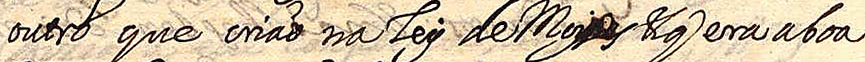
outro que criaõ na Ley de Moyses & q̄ era a boa
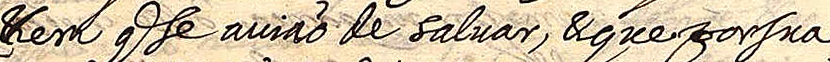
& em q̄ se auiaõ de saluar, & que por sua
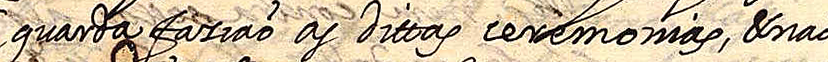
guarda faziaõ as dittas ceremonias, & naõ
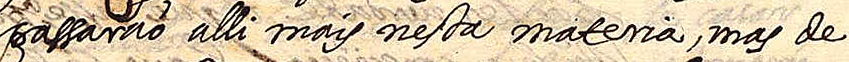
passaraõ alli mais nesta materia, mas de
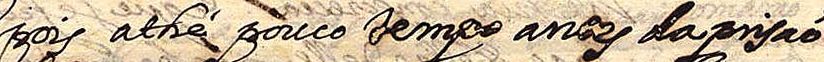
pois athé pouco tempo antes da prisaõ
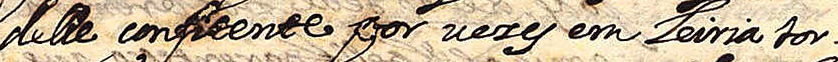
delle confitente por uezes em Leiria tor
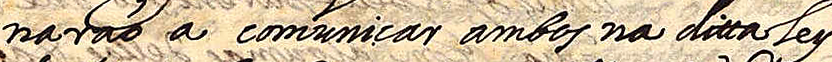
naraõ a comunicar ambos na ditta Ley
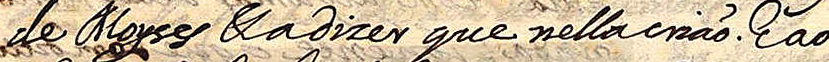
de Moyses & a dizer que nella criaõ. E ao
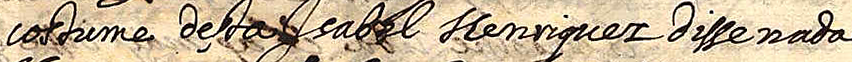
costume desta Jsabel Henriquez disse nada
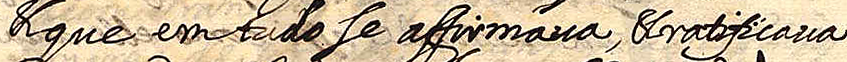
& que em tudo se affirmaua, & ratificaua
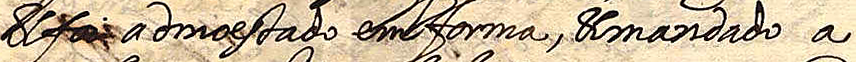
& foi admoestado em forma, & mandado a
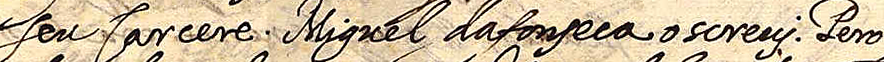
seu Carcere. Miguel da fonseca o screuj. Pero
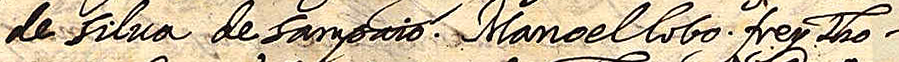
de Silua de Sampaio. Manoel lobo, frey Tho
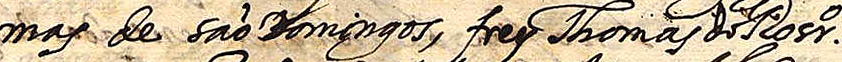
mas de saõ Domingos, frey Thomas do Rosro.
